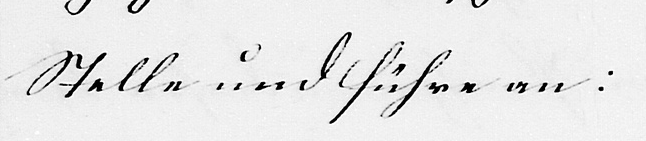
Stelle und führe an:
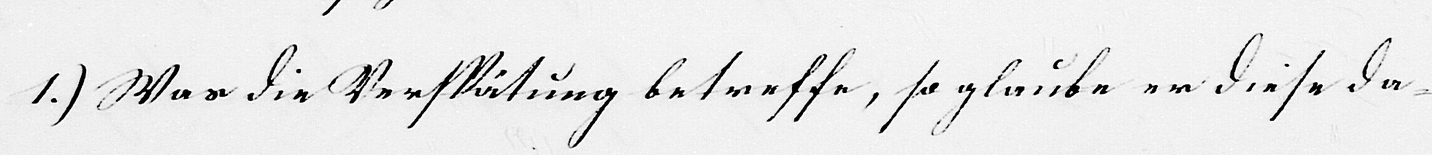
1.) Was die Verspätung betreffe, so glaube er diese da¬
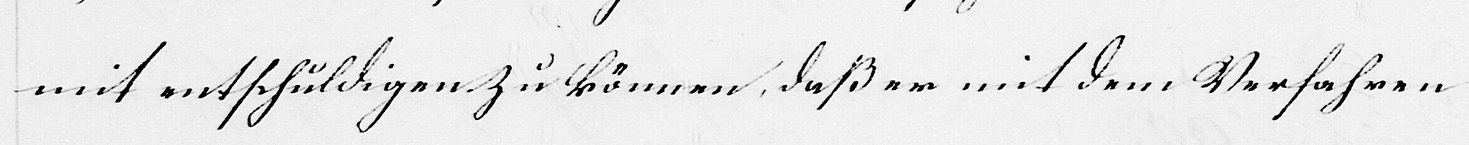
mit entschuldigen zu können, daß er mit dem Verfahren
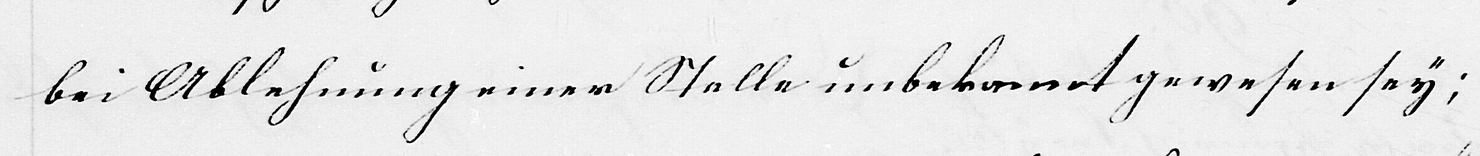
bei Ablehnung einer Stelle unbekannt gewesen sey;
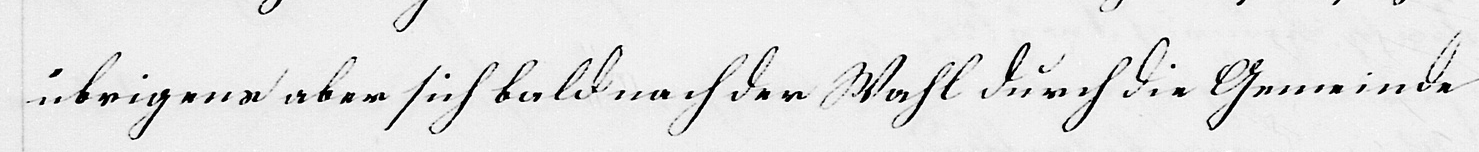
übrigens aber sich bald nach der Wahl durch die Gemeinde
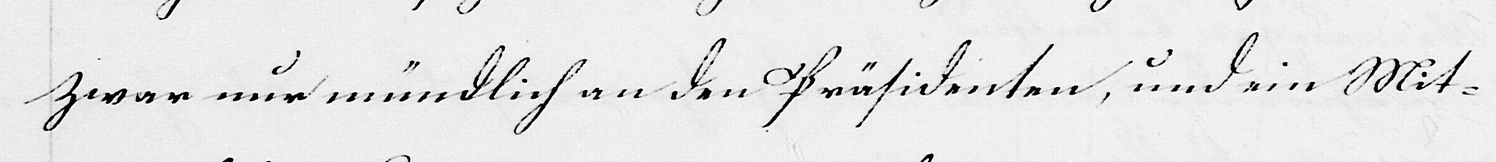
zwar nur mündlich an den Präsidenten, und ein Mit¬
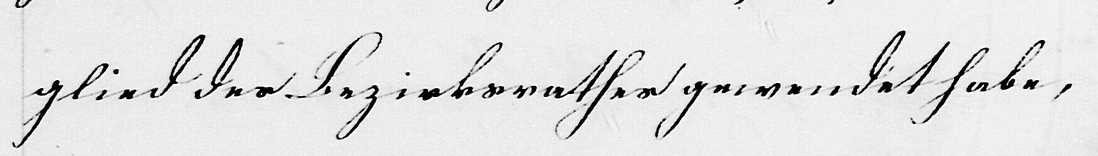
glied des Bezirksrathes gewendet habe,
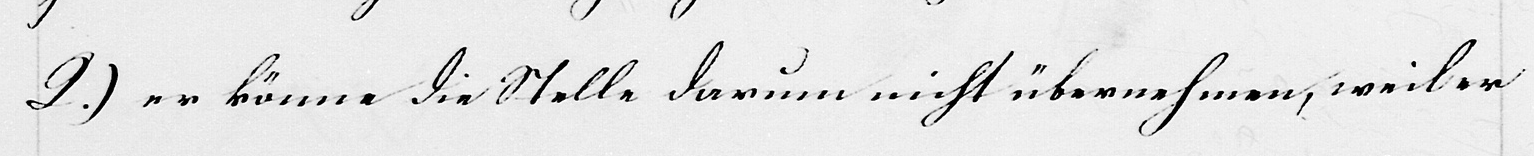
2.) er könne die Stelle darum nicht übernehmen, weil er
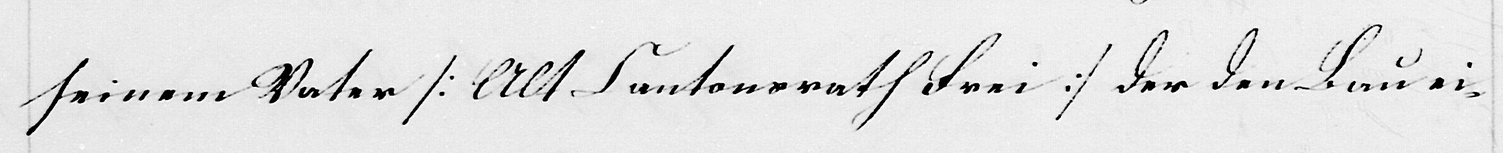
seinem Vater [Alt Cantonsrath Frei] der den Bau ei¬
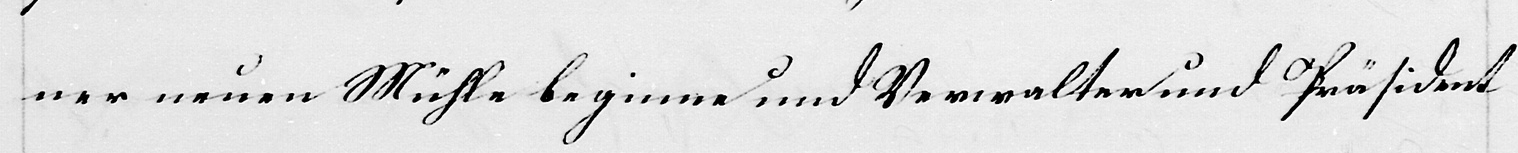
ner neuen Mühle beginne und Verwalter und Präsident
